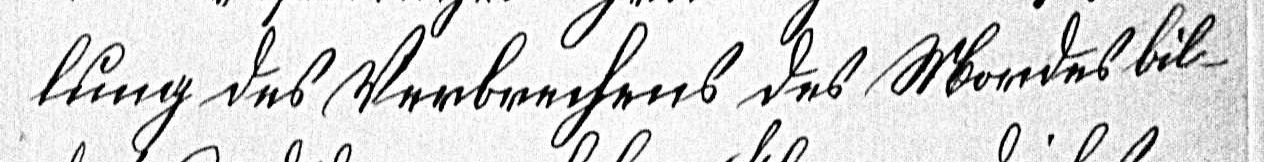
lung des Verbrechens des Mordes bil¬
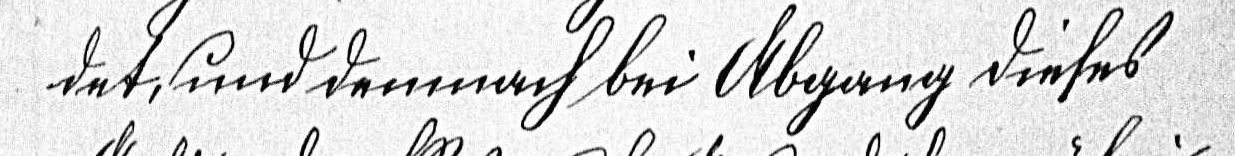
det und demnach bei Abgang dieses
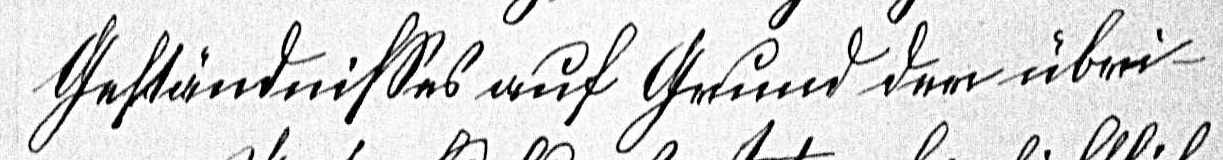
Geständnises auf Grund der übri¬
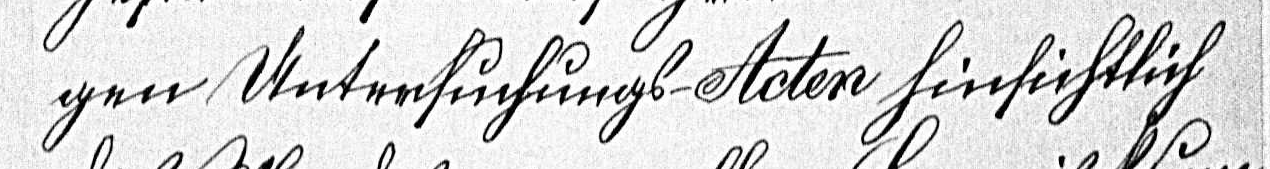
gen Untersuchungs-Acten hinsichtlich
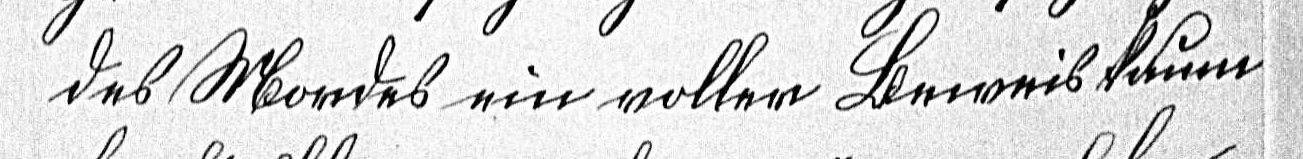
des Mordes ein voller Beweis kaum
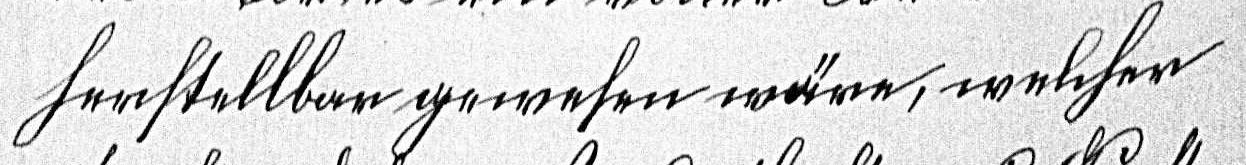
herstellbar gewesen wäer, welcher
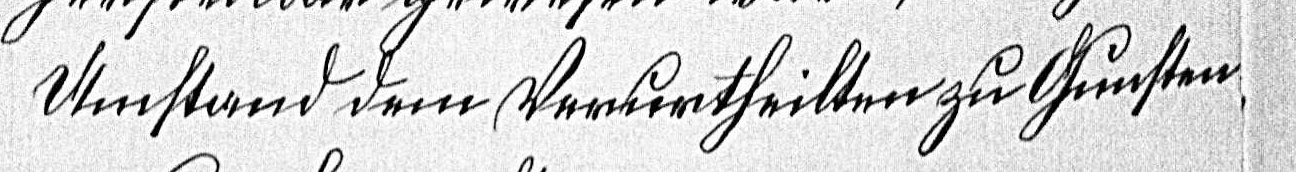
Umstand dem Verurtheilten zu Gunsten
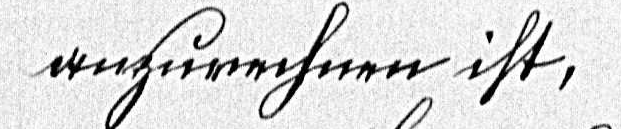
anzurechnen ist,
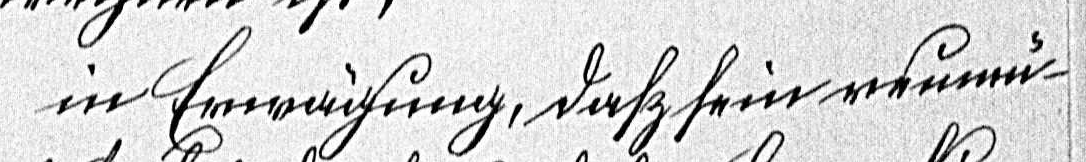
in Erwägung, daß sein reumü¬
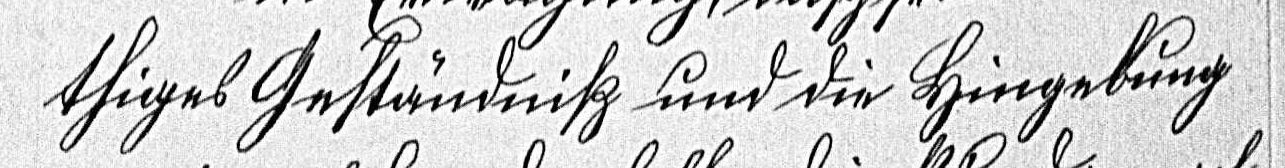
thiges Geständniß und die Hingebung
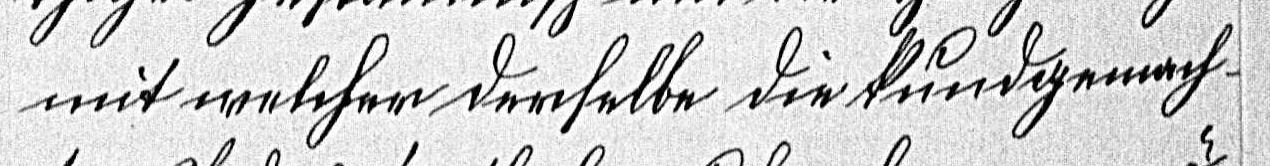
mit welcher derselbe die Kundgemach¬
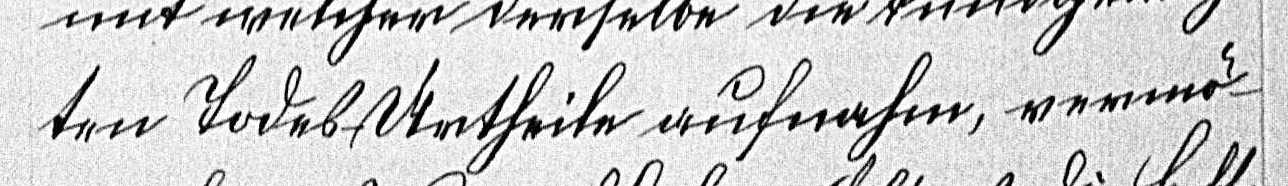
ten Todes-Urtheile aufnahm, vermö¬
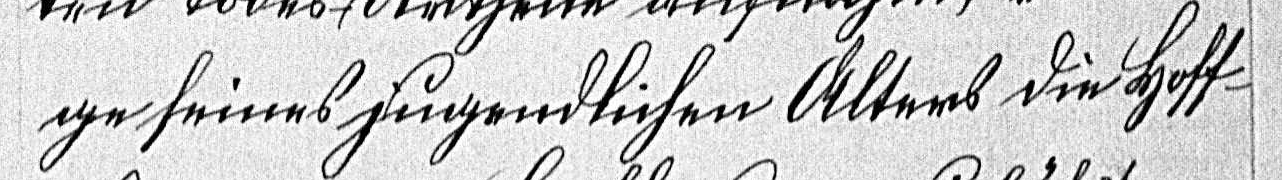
ge seines jugendlichen Alters die Hoff¬
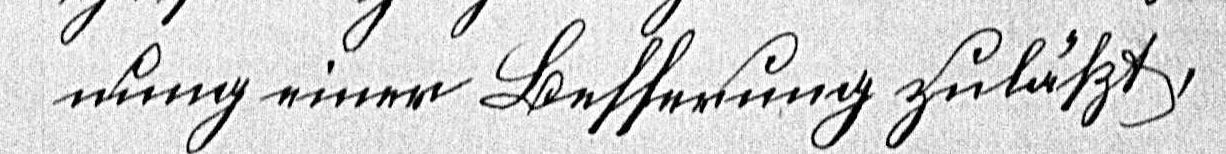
nung einer Besserung zuläßt,
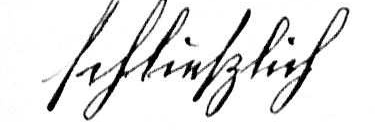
schließlich
